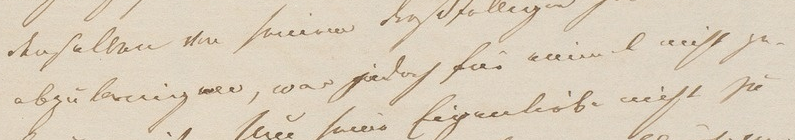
abzubringen, was jedoch für einmal nicht ge-
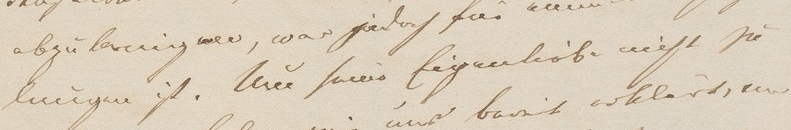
lungen ist. Um seine Eigenliebe nicht zu
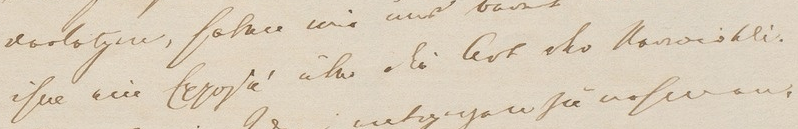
ihm ein Exposé über die Art der Verwirkli-
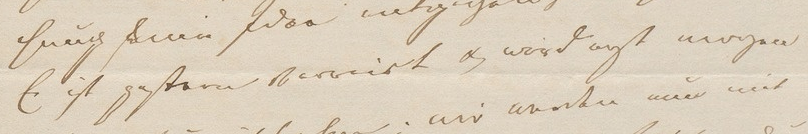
Er ist gestern verreist & wird erst morgen
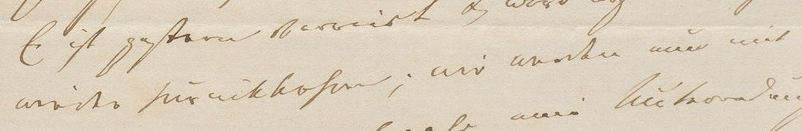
wieder zurückkehren; wir werden nun mit
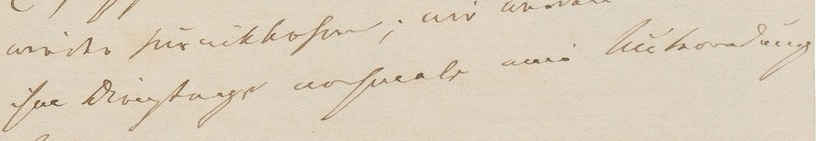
ihm Dienstags nochmals eine Unterredung
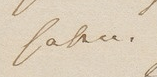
haben.
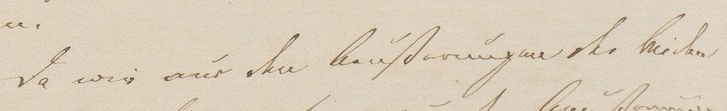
Da wir aus den Aeußerungen der beiden
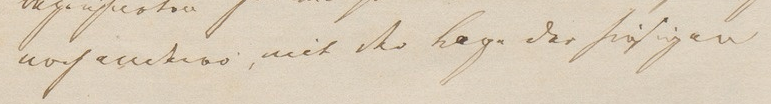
noch anderer, mit der Lage des hiesigen
